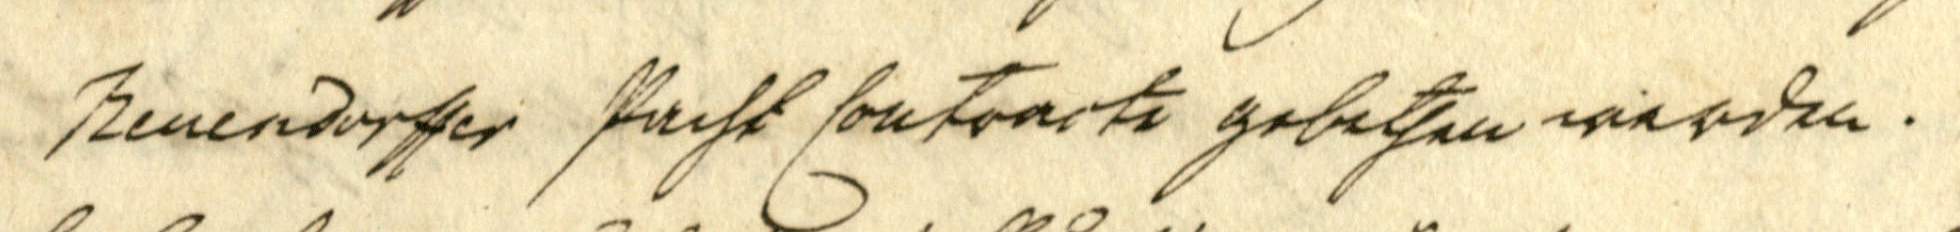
Neuendorffer Pacht Contracte gebethen werden.
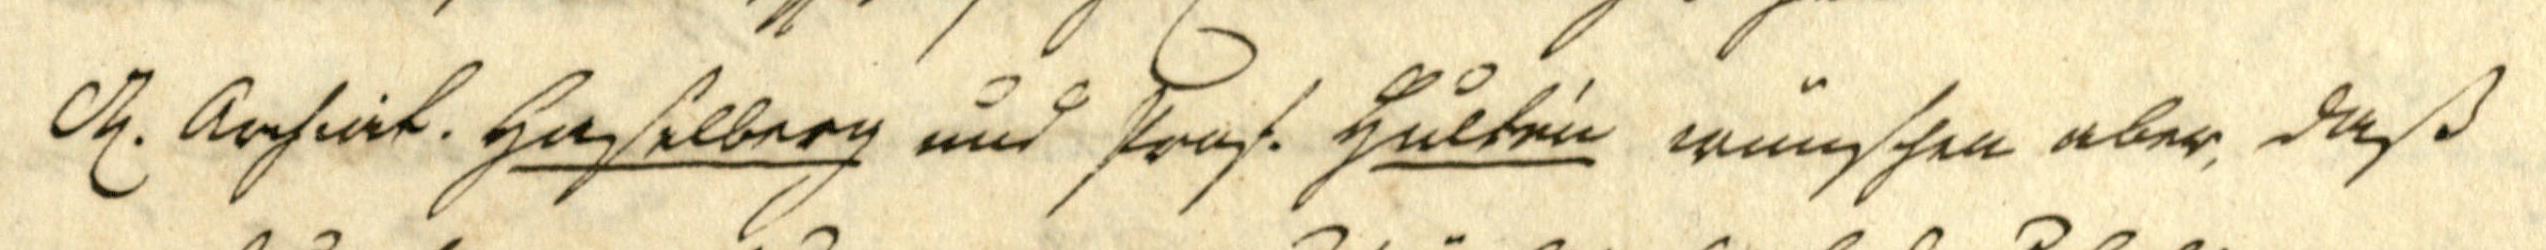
dh. Archiat. Haselberg und Prof. Hultén wünschen aber, daß
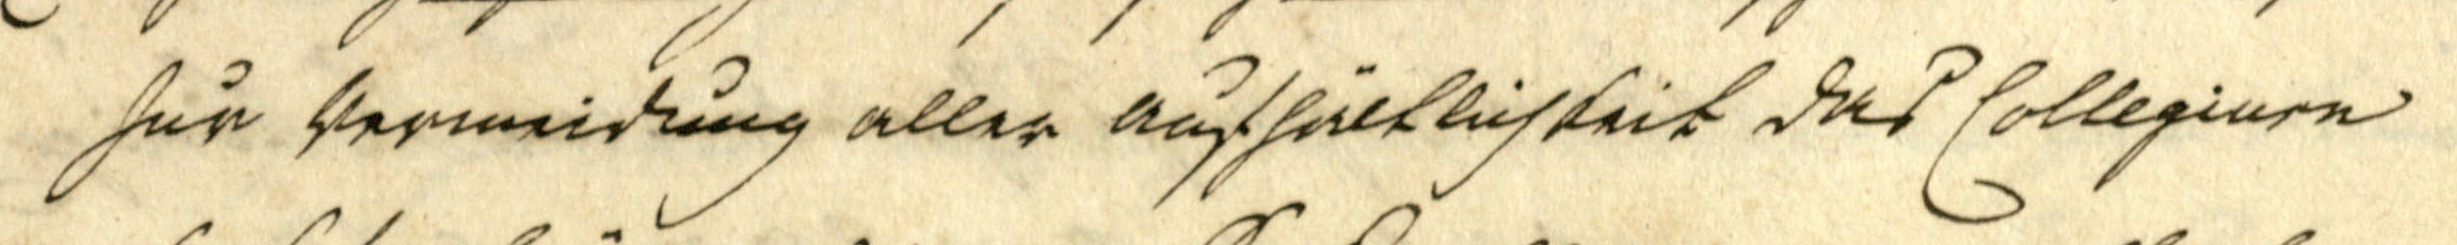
zur Vermeidung aller Aufhältlichkeit das Collegium
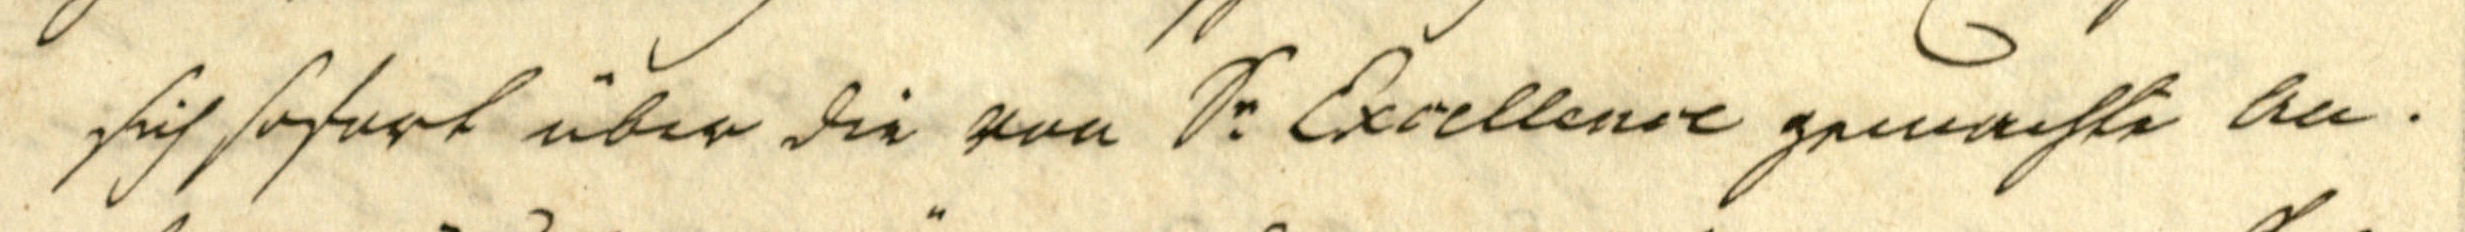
sich sofort über die von Sr Excellence gemachte An¬
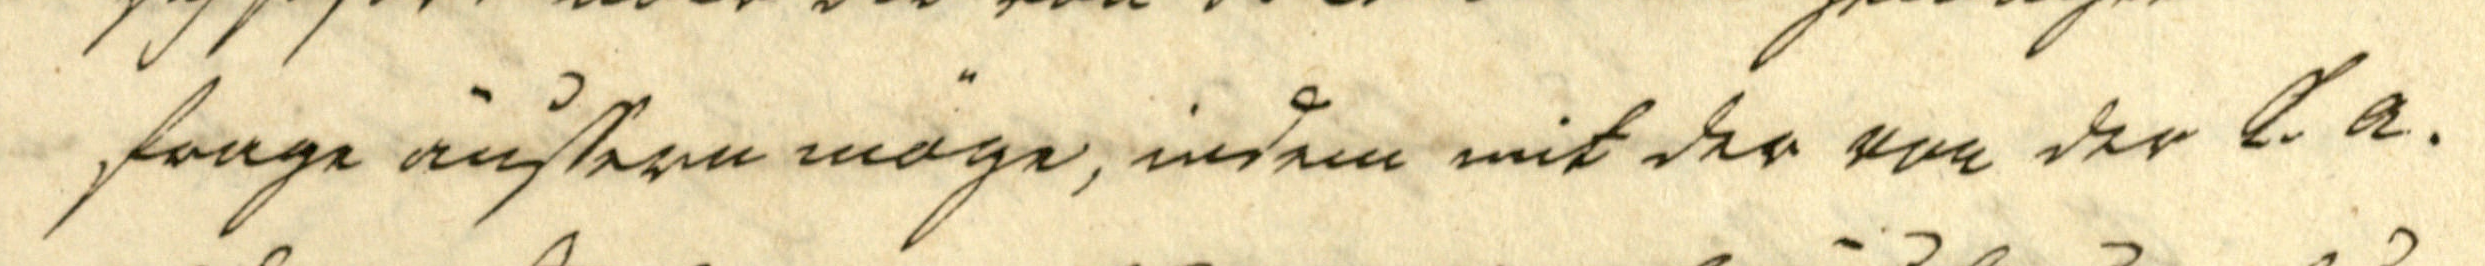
frage äussern möge, indem mit der von der K. A.
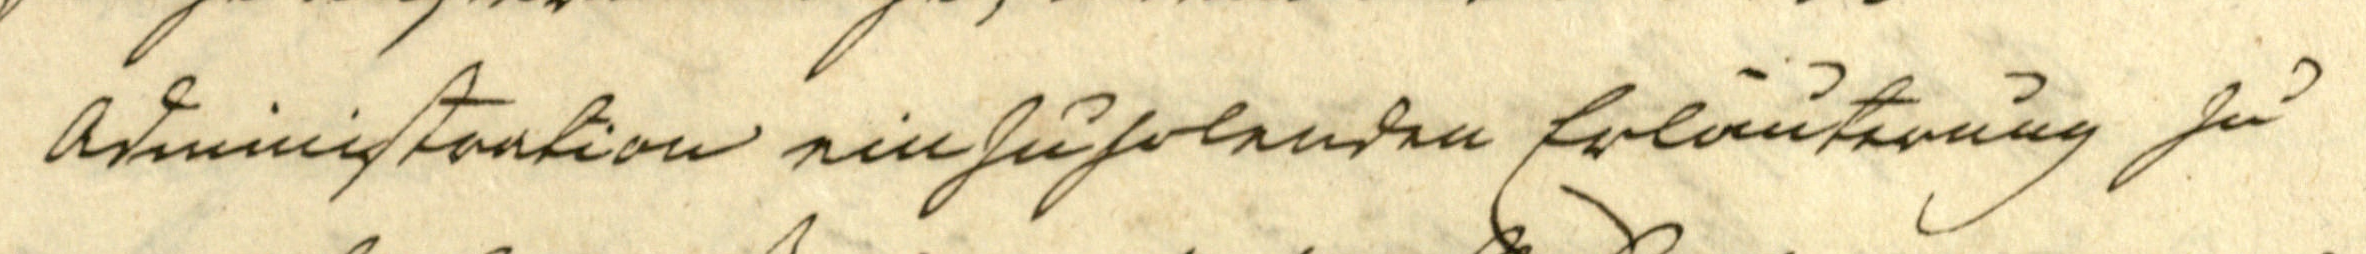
Administration einzuholenden Erläuterung zu
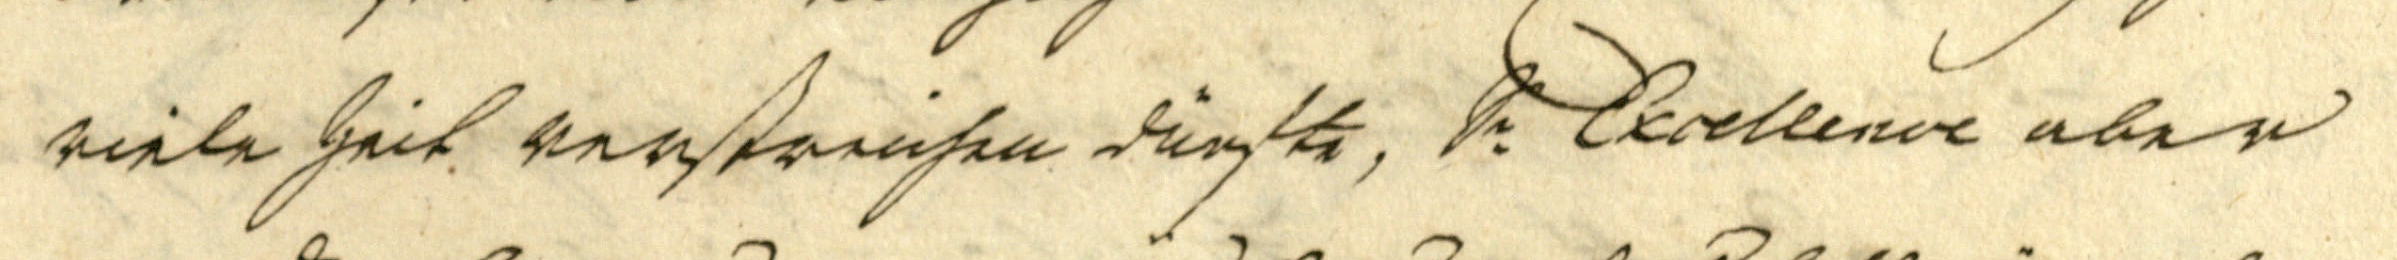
viele Zeit verstreichen dürfte, Sr Excellence aber
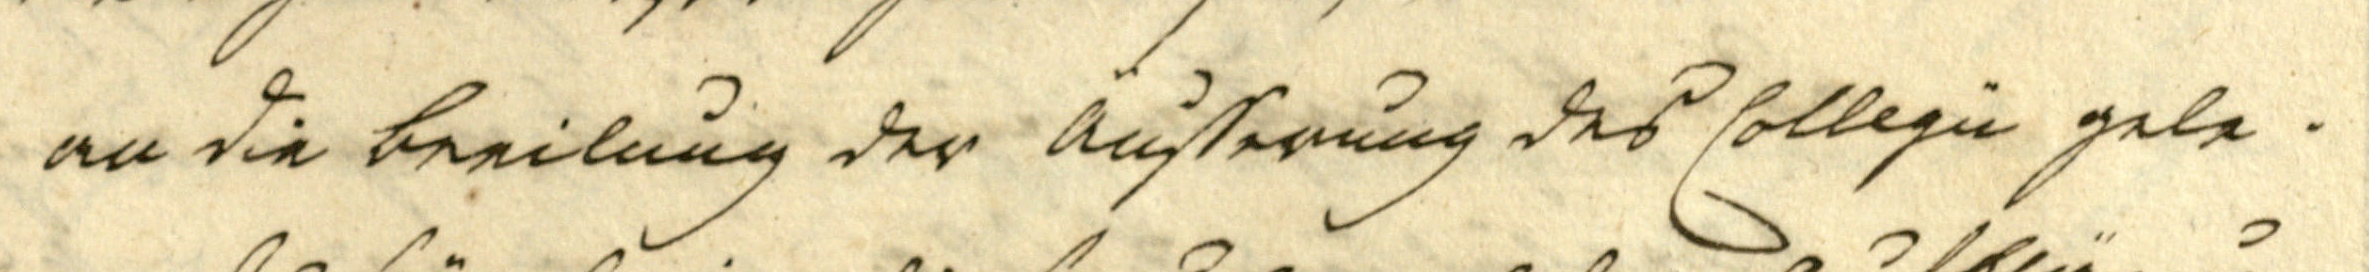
an die Beeilung der Äusserung des Collegii gele¬
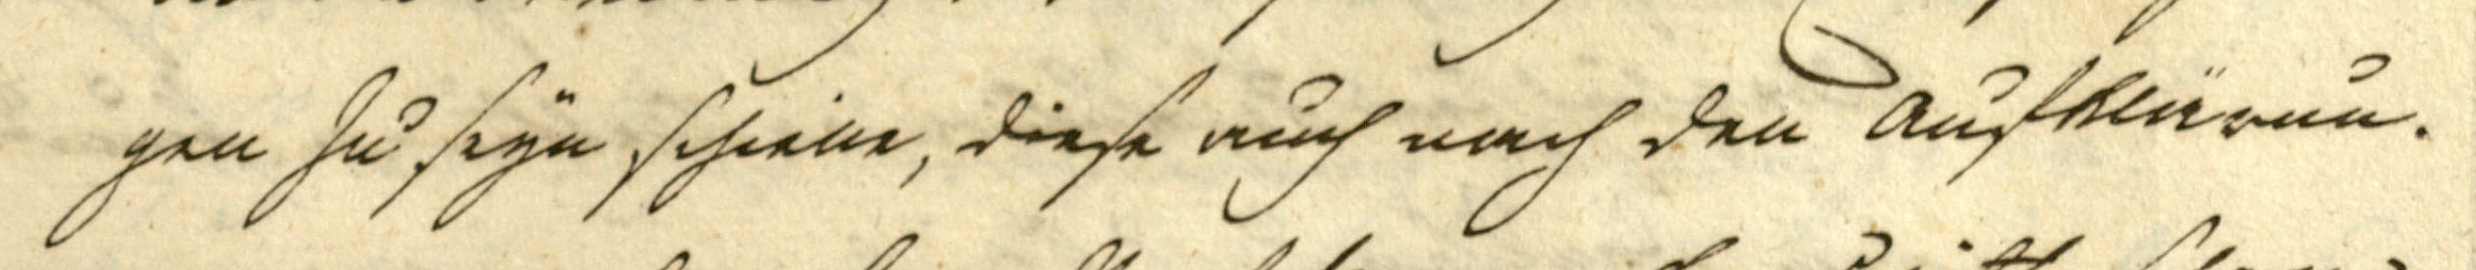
gen zu seÿn schiene, diese auch nach den Aufklärun¬
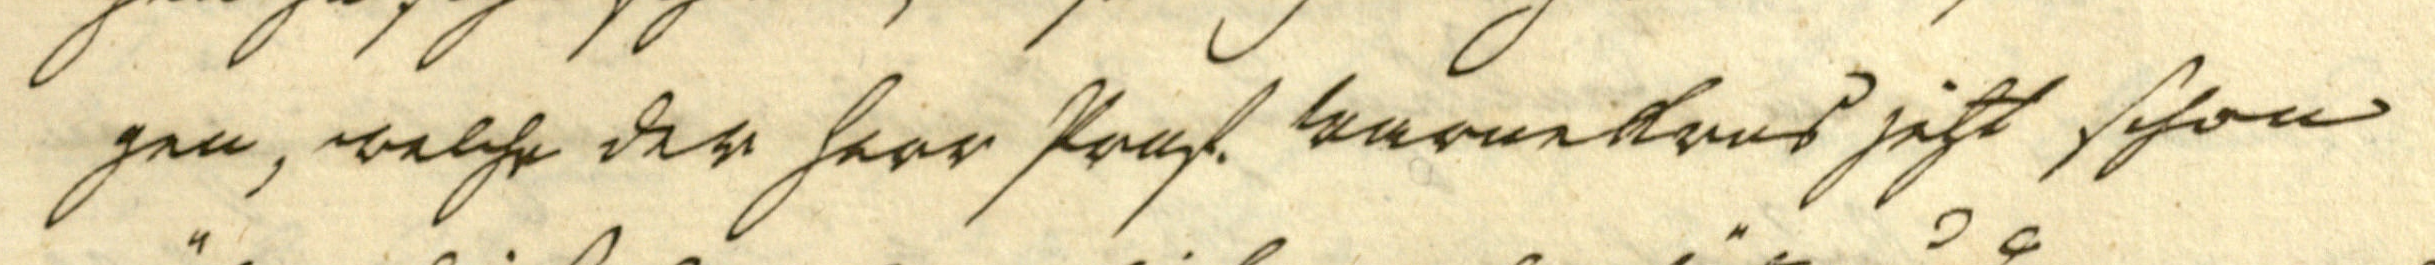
gen, welche der Herr Prof. Warnekros jetzt schon
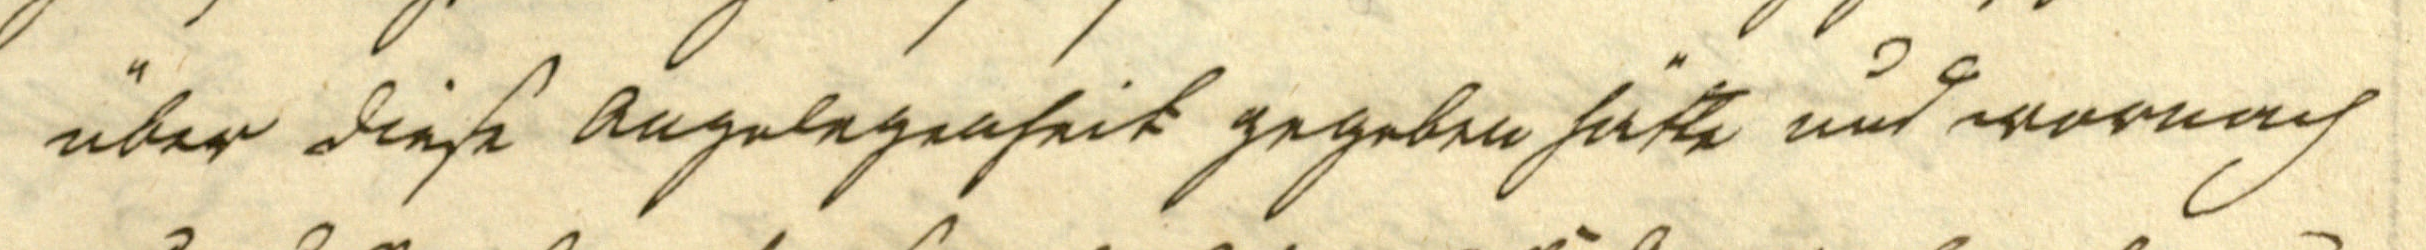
über diese Angelegenheit gegeben hätte und wornach
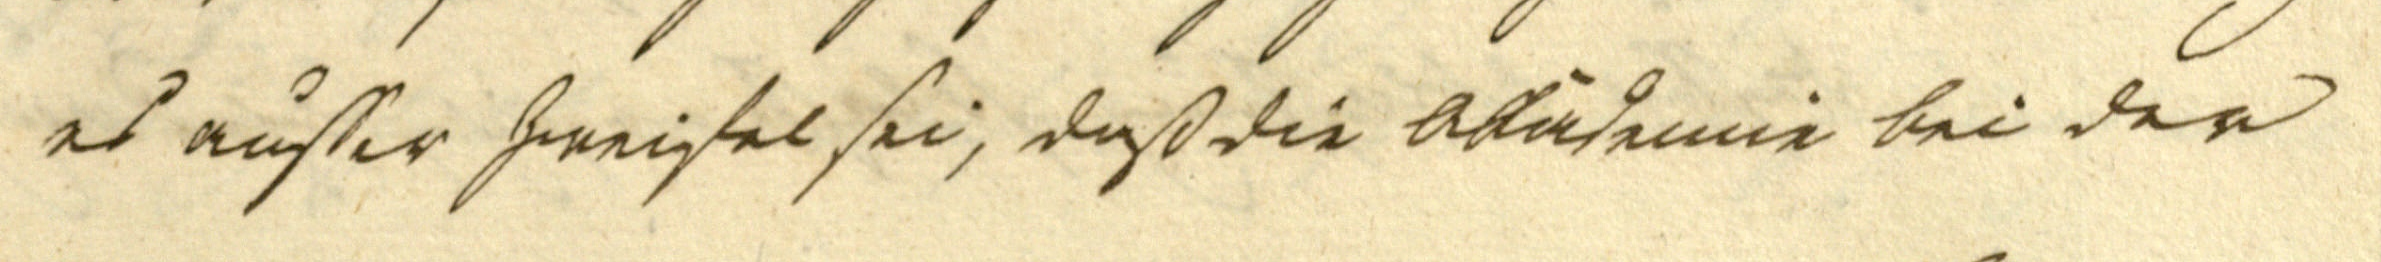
es ausser Zweifel sei, daß die Akademie bei der
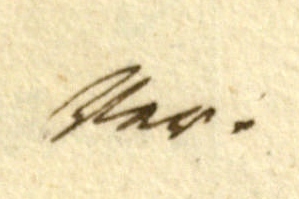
Ver¬
